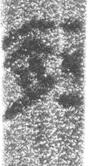宜
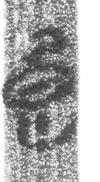節
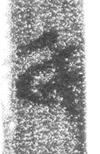身
